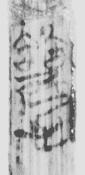{雚心}
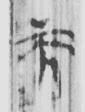天
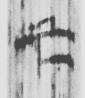下
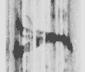之
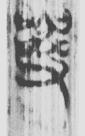亂
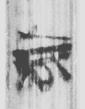者
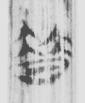昔
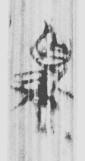{日虫頁}
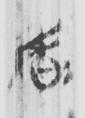后
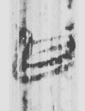戶
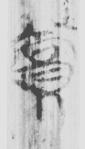賞
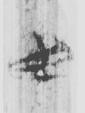民
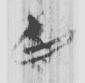㠯（以）
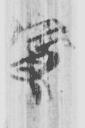貪
